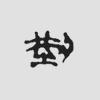型
